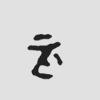首
